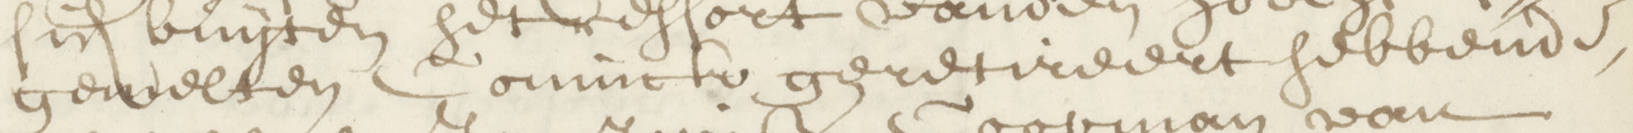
gemelten Coninck geretireert hebbende,
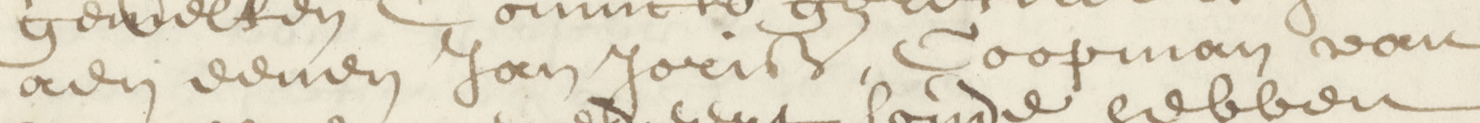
aen eenen Jan Joriss, Coopman van
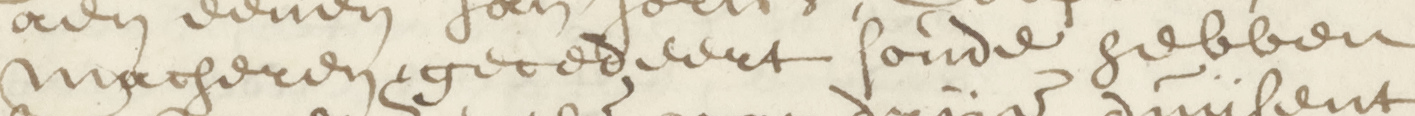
Macheren, gecedeert soude hebben
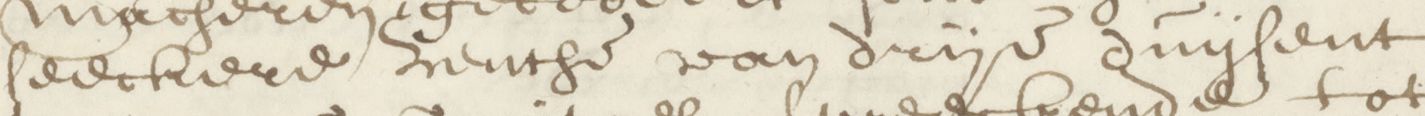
seeckere renthe van drije duijsent
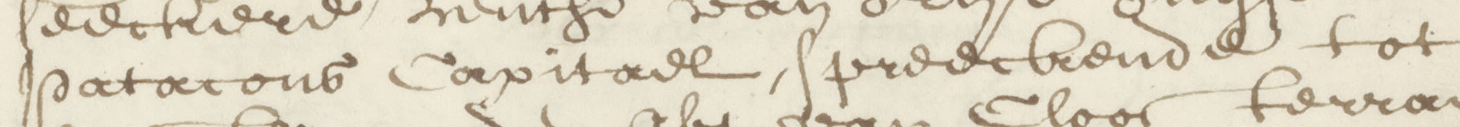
patacons Capitael, spreeckende tot
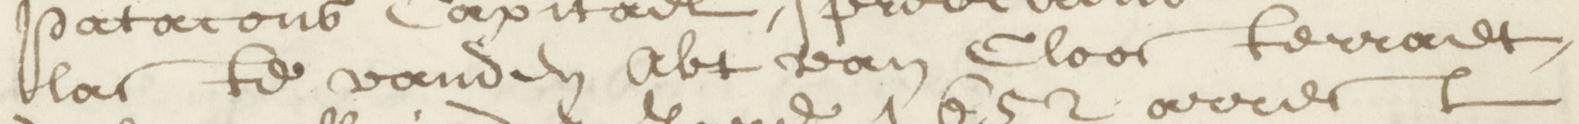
laste vanden abt van Cloosterraet
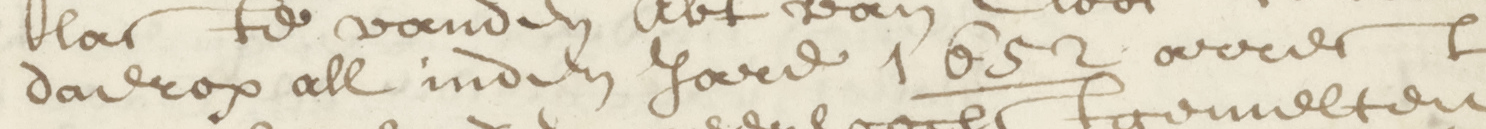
daerop all inden Jare 1652 arrest
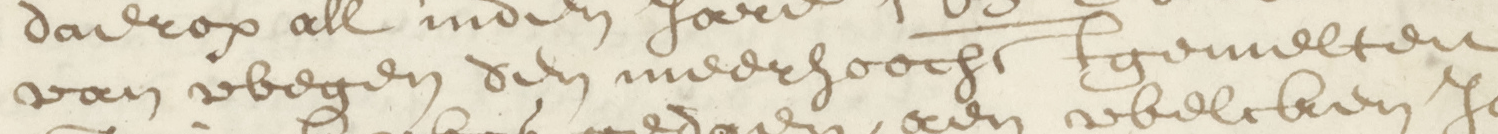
van wegen den meerhoochstgemelten
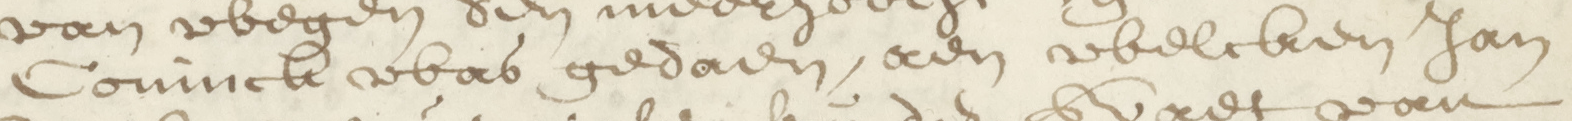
Coninck was gedaen, aen welcken Jan
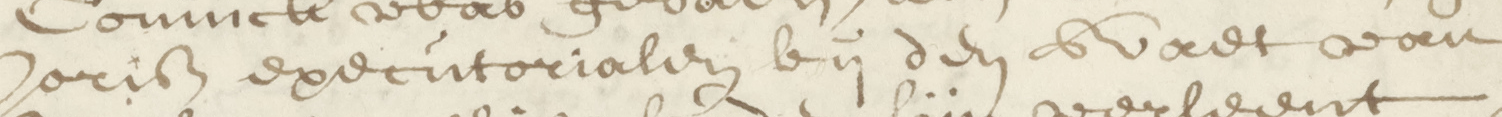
Joriss executorialen bij den Raet van
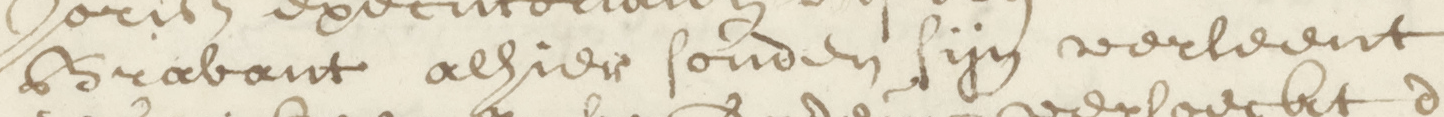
Brabant alhier souden sijn verleent,
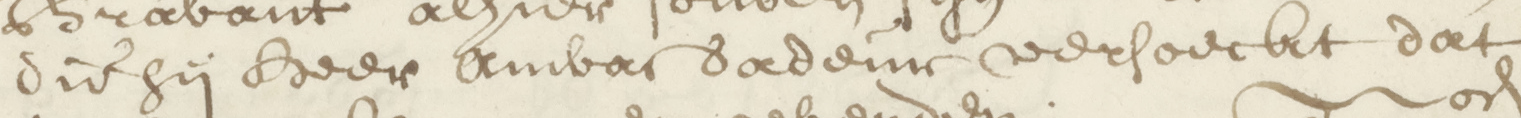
dat hij heer ambassadeur versoeckt dat
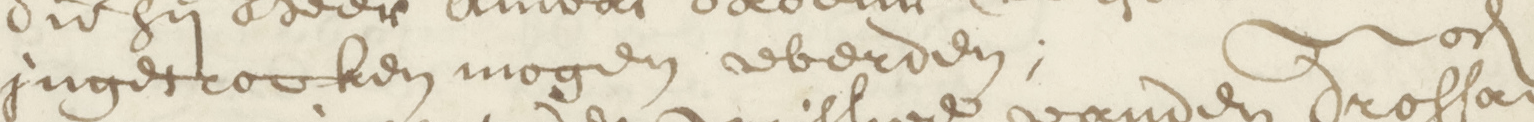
ingetrocken mogen werden; Noch
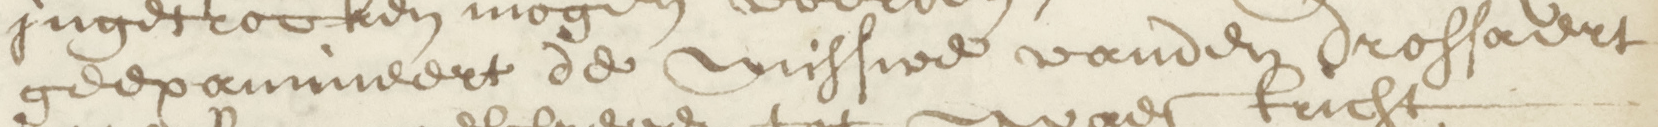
geexamineert de missive vanden drossaert
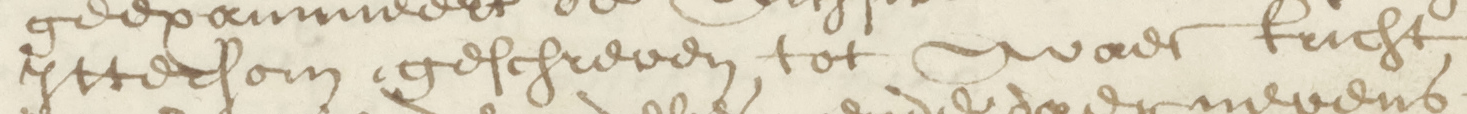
Ittersom, geschreven tot Maestricht
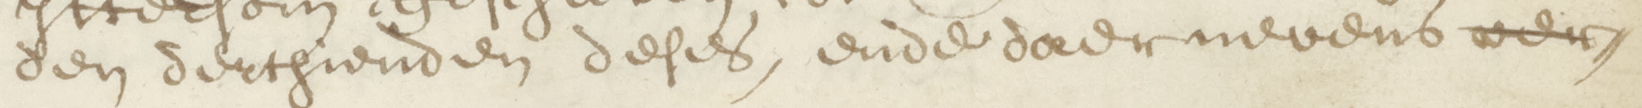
den derthienden deses, ende daer nevens een
